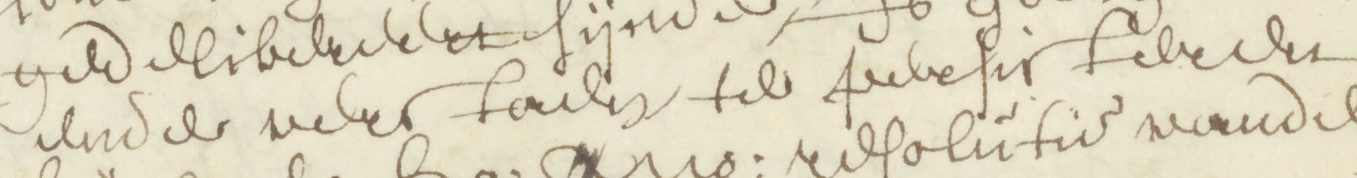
ende verstaen, te persisteren
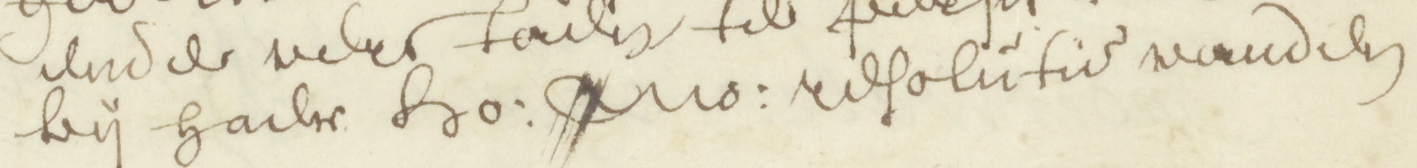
bij haer Ho:Mo: resolutie vanden
